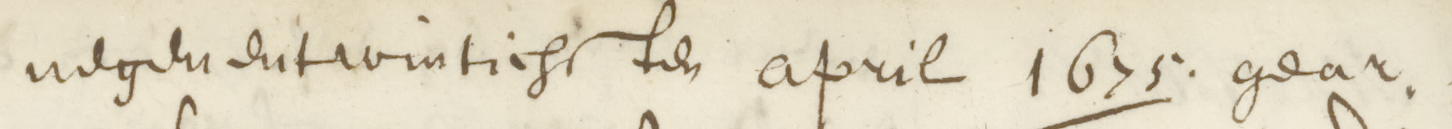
negenentwintichsten april 1675. gear,
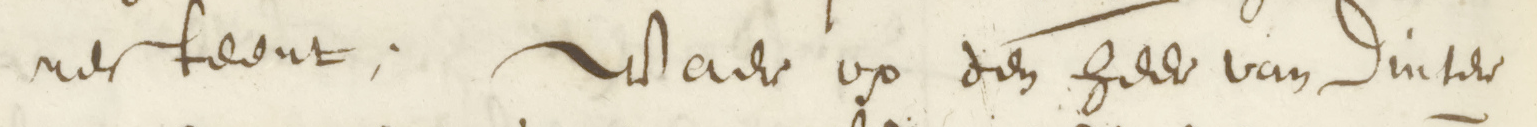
resteert; Waer op den heer van Dinter
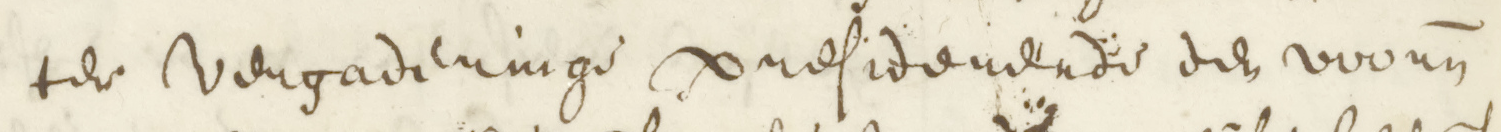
ter vergaderinge presiderende den voorn
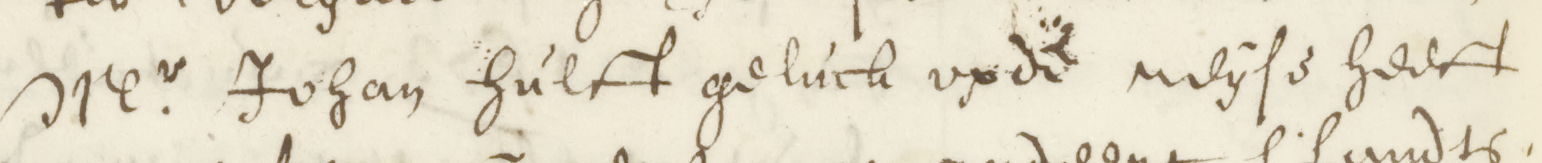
Mr. Johan hulst geluck opde reijse heeft
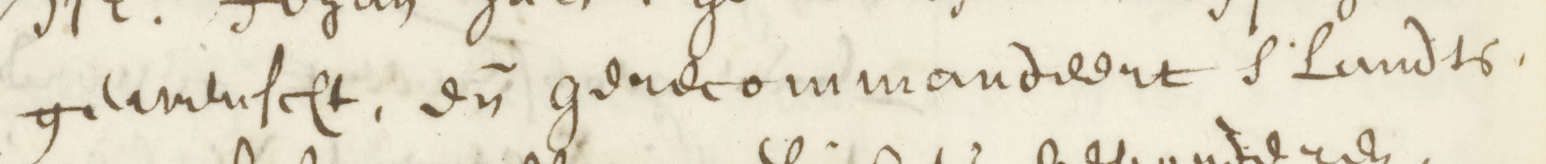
gewenscht, en gerecommandeert s'Landts
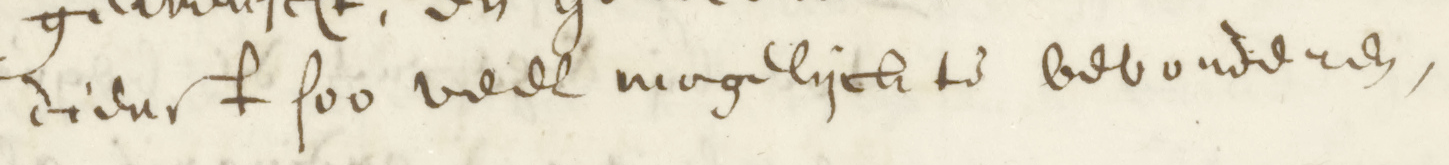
dienst soo veel mogelijck te bevorderen.
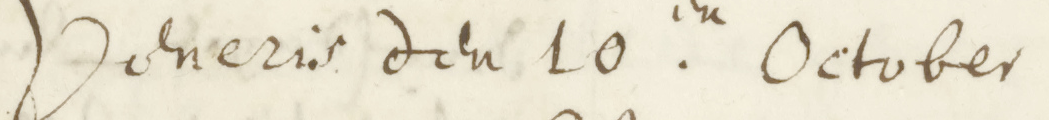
Veneris den 10en. October
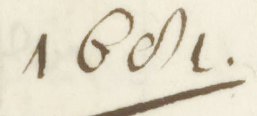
1681.
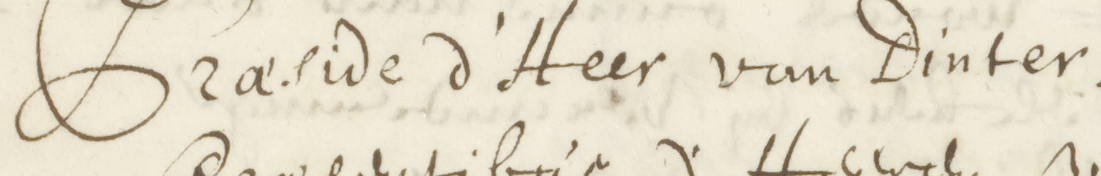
Pra'side d'Heer van Dinter.
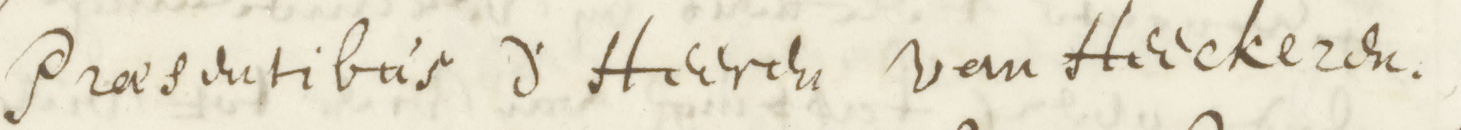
Præsentibus d'Heeren van Heeckeren.
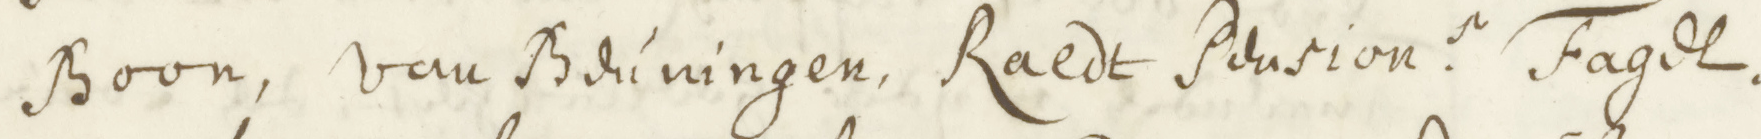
Boon, van Beuningen, Raedt Pensions. Fagel.
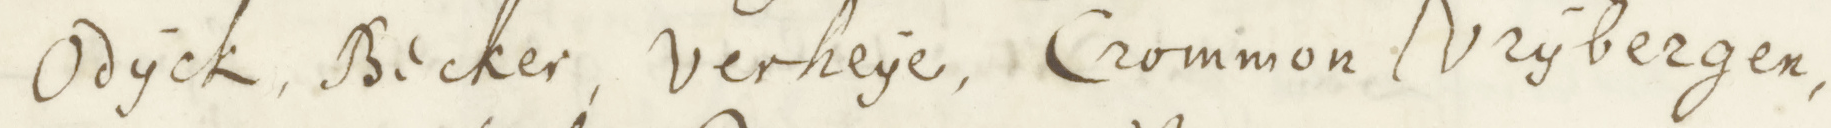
Odijck, Becker, Verheije, Crommon Vrijbergen,
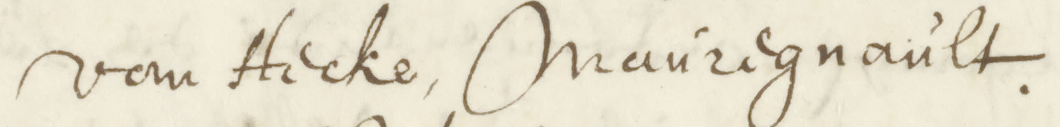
van Hecke, Mauregnault.
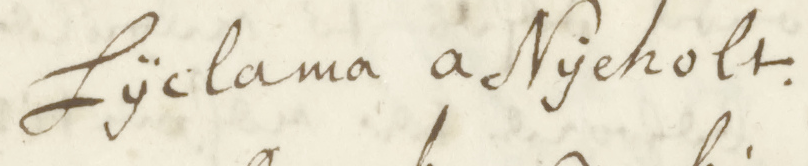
Lijclama a Nijeholt.
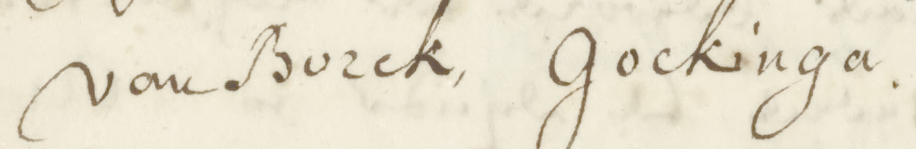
van Borck, Gockinga.
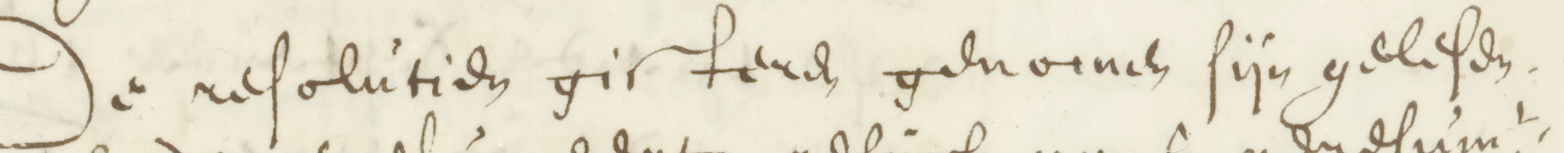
De resolutien gisteren genomen sijn gelesen
